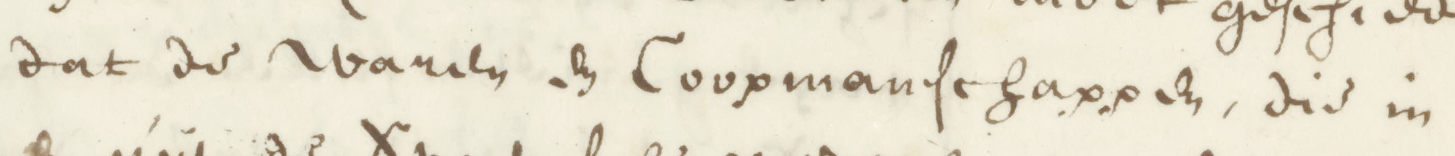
dat de waren en Coopmanschappen, die in
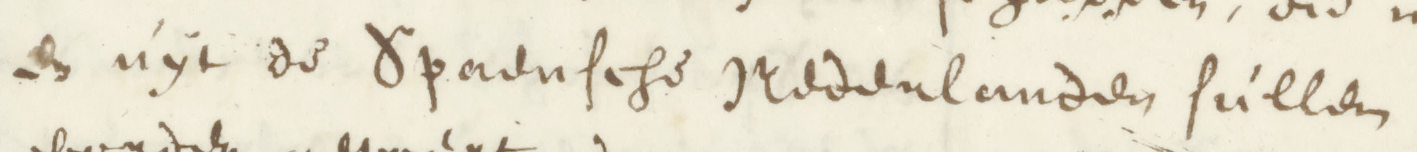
en uijt de Spaensche Nederlanden sullen
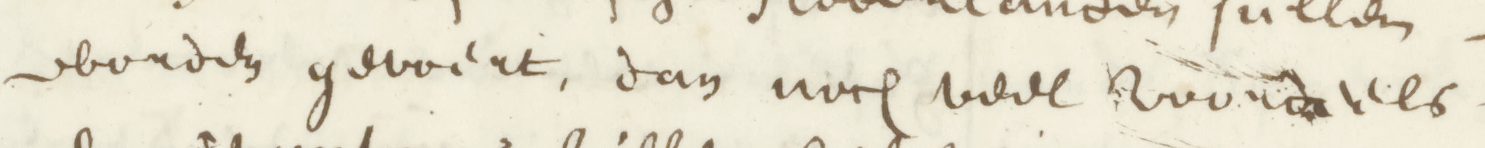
worden gevoert, dan noch veel voordeels
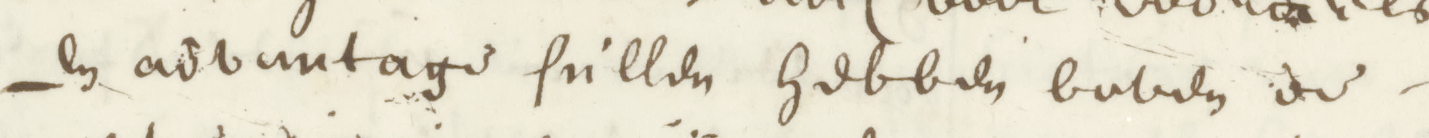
en advantage sullen hebben boven de
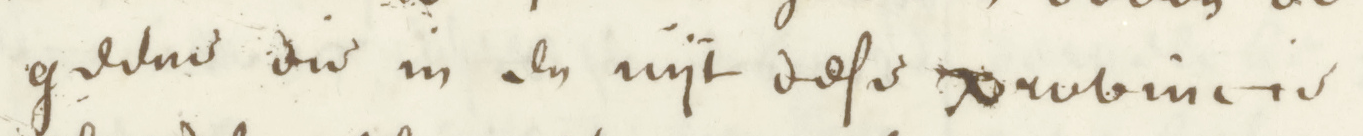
geene die in en uijt dese provincie
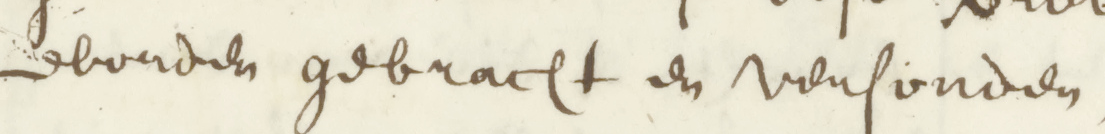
worden gebracht en versonden.
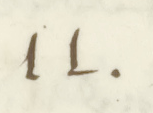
11.
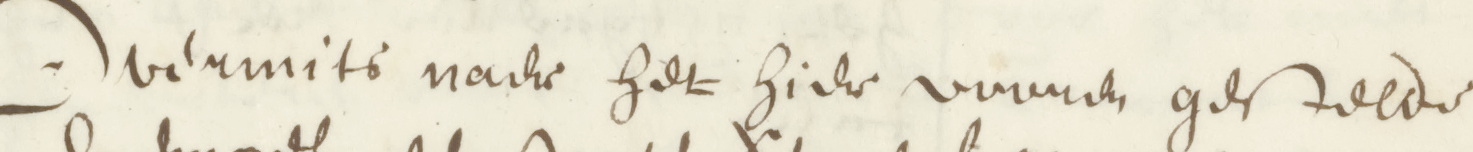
Overmits naer het hier vooren gestelde
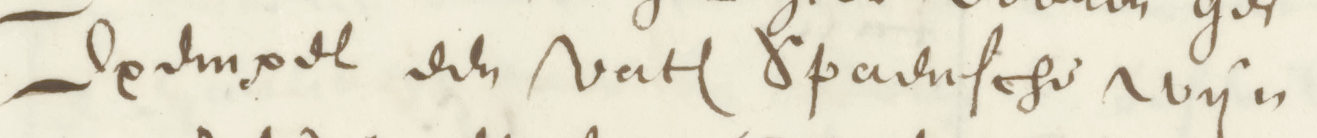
exempel een vath Spaensche wijn
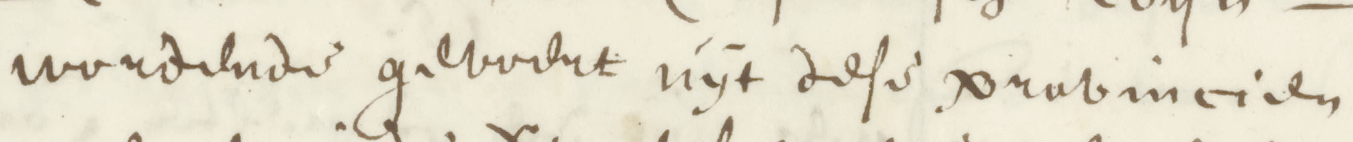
wordende gevoert uijt dese provincien
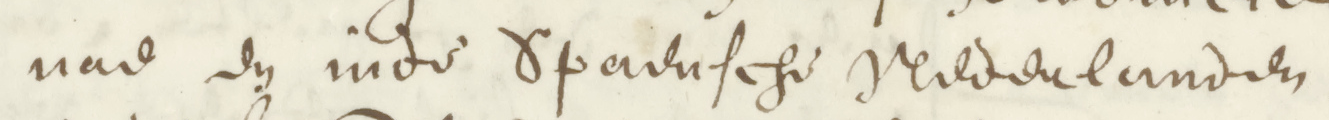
nae en inde Spaensche Nederlanden,
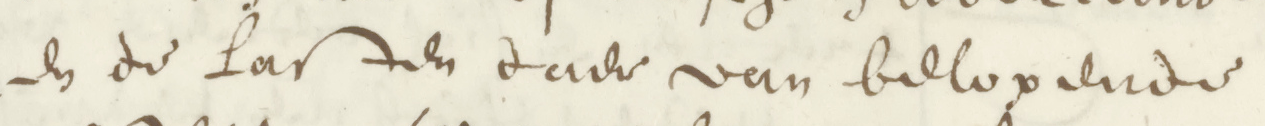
en de lasten daer van belopende
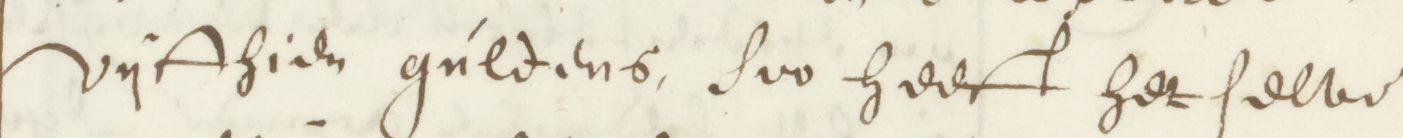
vijfthien guldens, soo heeft het selve
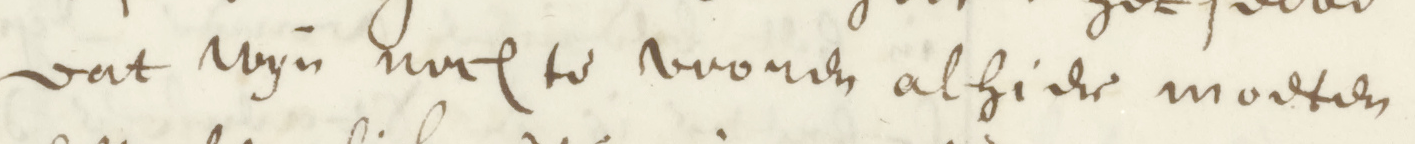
vat wijn noch te vooren alhier moeten
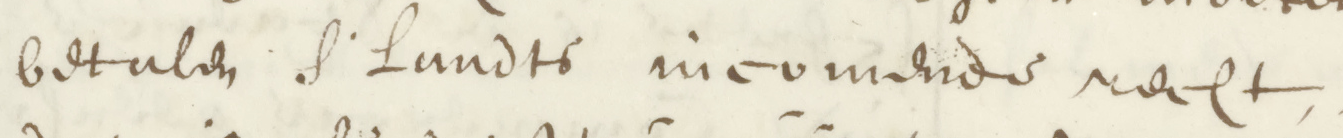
betalen s'Landts incomende recht,
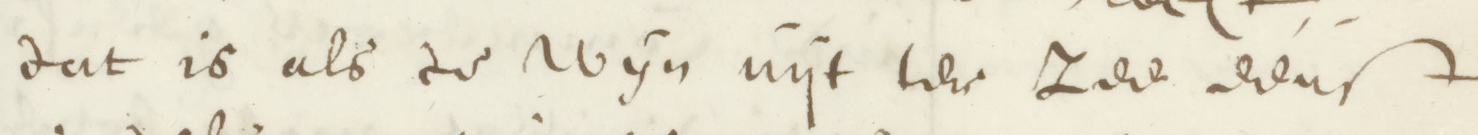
dat is als de wijn uijt ter Zee eerst
